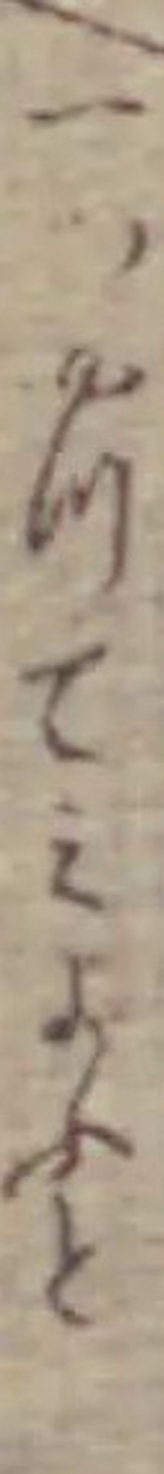一ッやつてみよふと
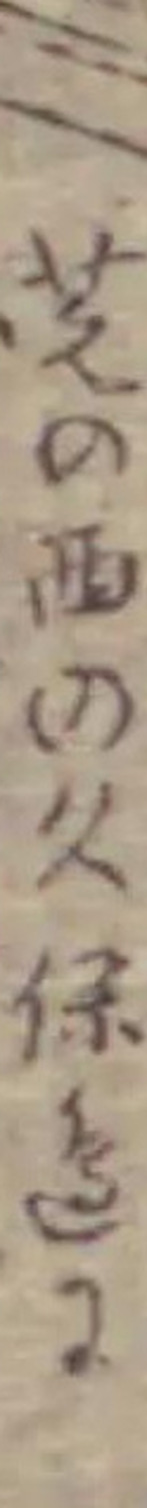芝の西の久保辺に
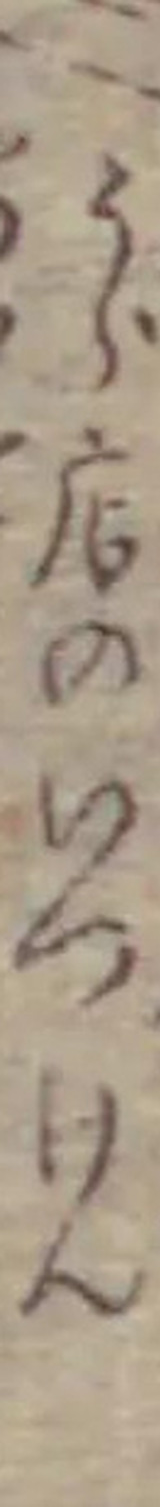うら店のいつけん
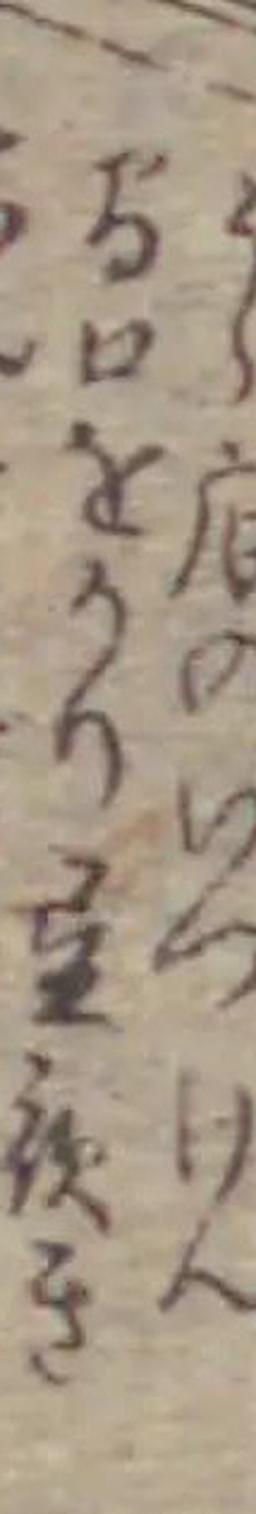間口をかり昼夜き
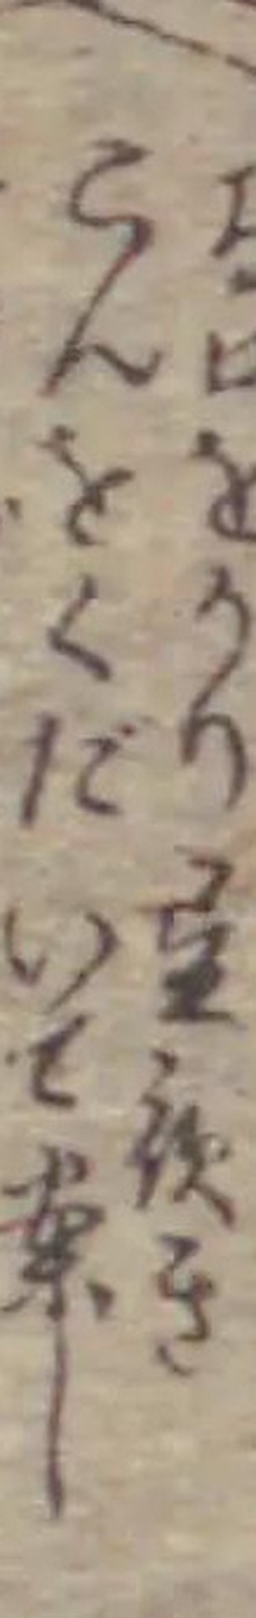こんをくだいて案し
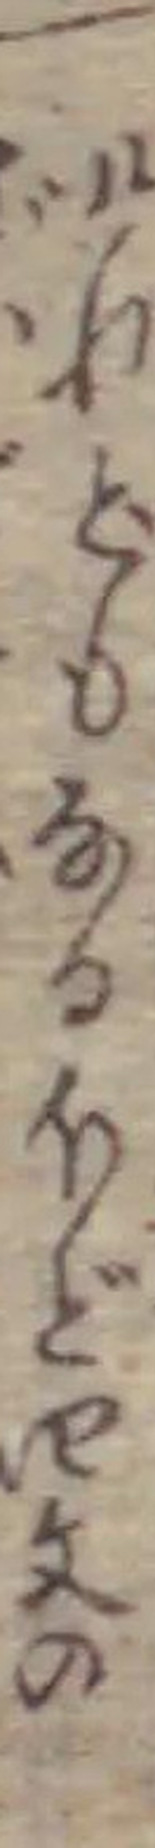けれどもなるほど四文の
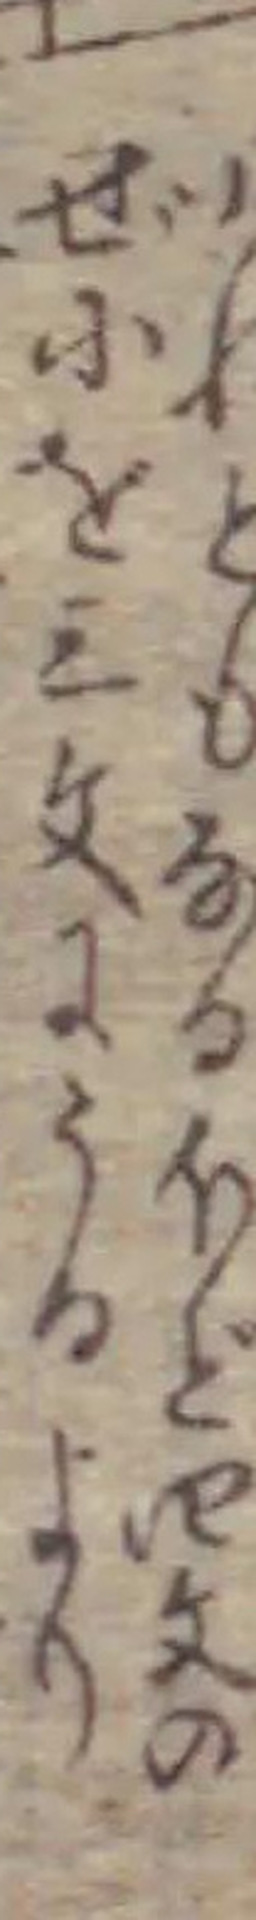ぜにを三文にうるより
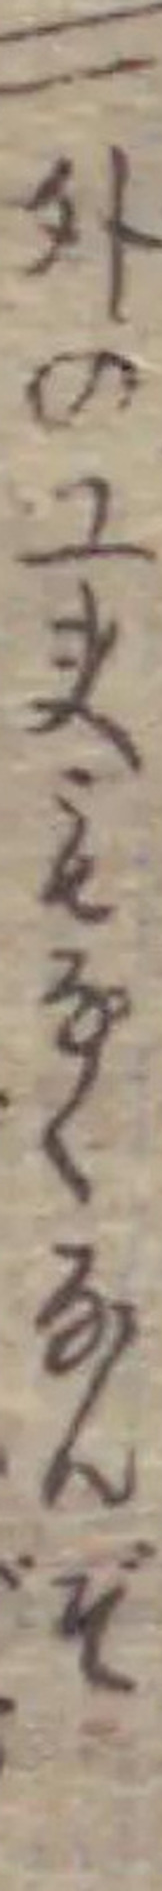外の工夫もなくなんぞ
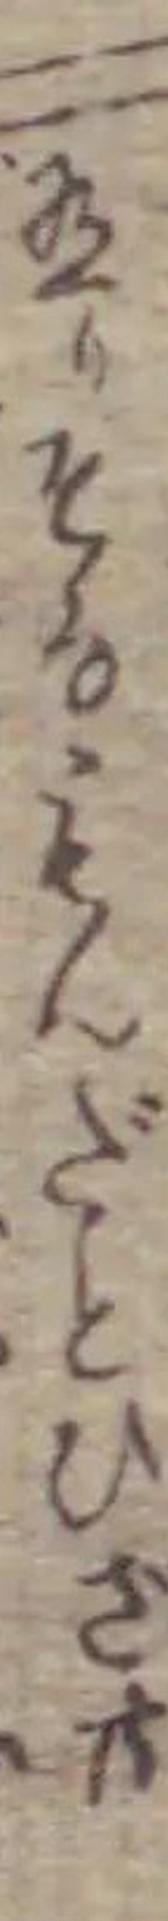有りそなもんだとひざ共
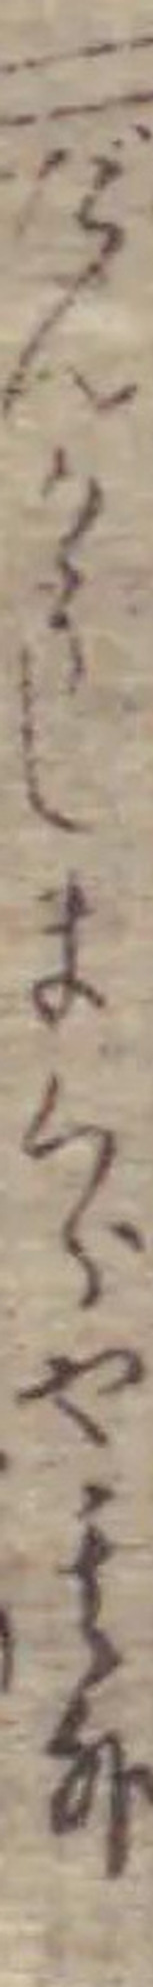だんかうしまくらや其外
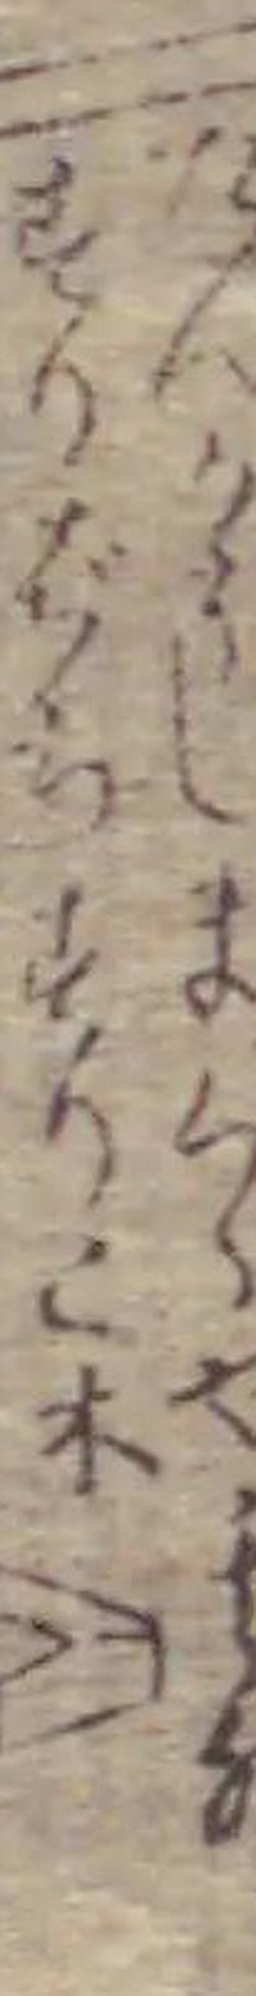すりばちすりこ木
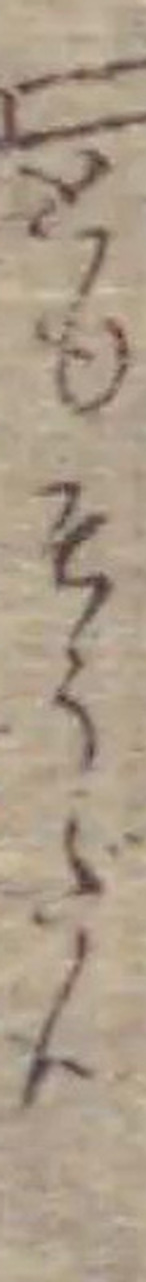ともそうだん
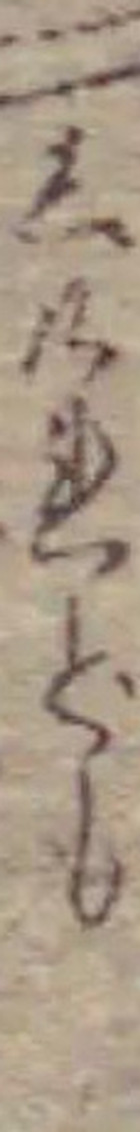しけれども
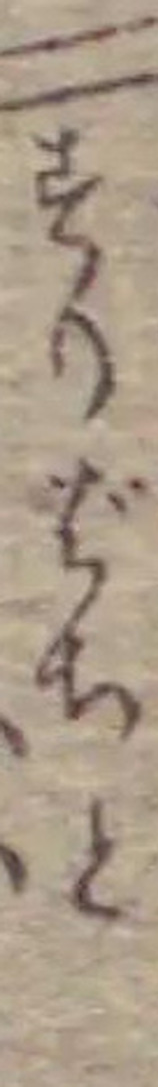すりばちと
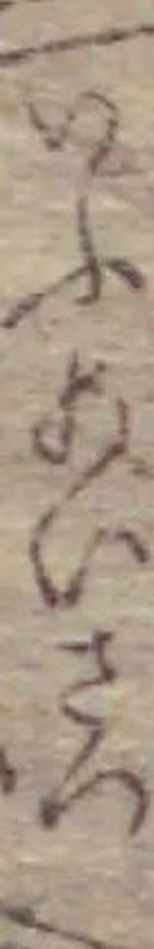いふあいさつ
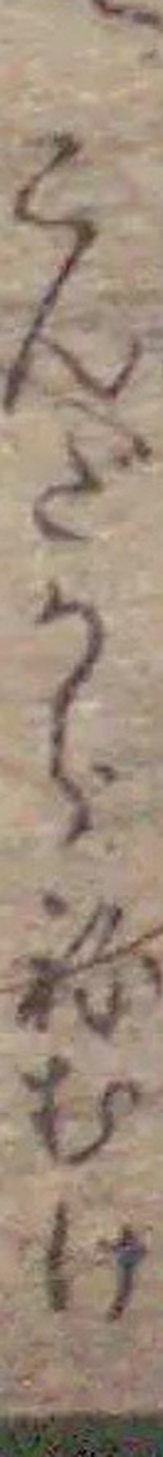こんだからねむけ
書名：栄増眼鏡徳 3巻
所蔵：国立国会図書館 National Diet Library, JAPAN
